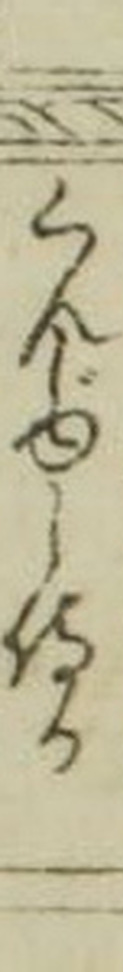くんじゆし侍る
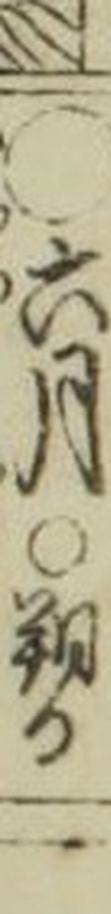○六月◯朔日
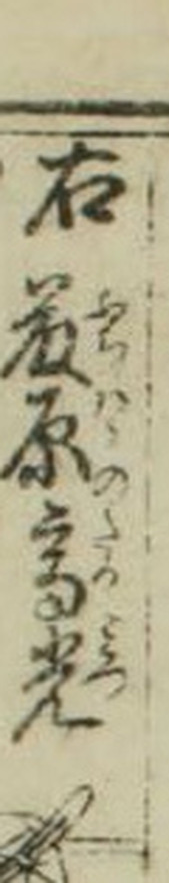右藤原高光
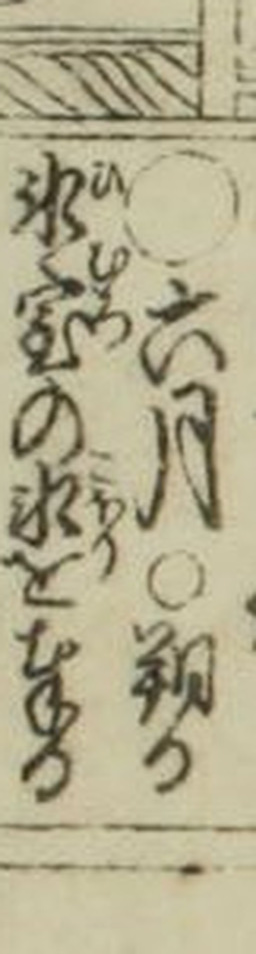氷室の氷を奉る
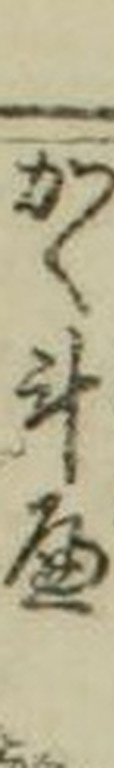かく計へ
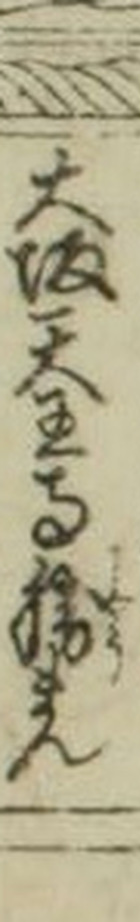大坂天王寺勝まん
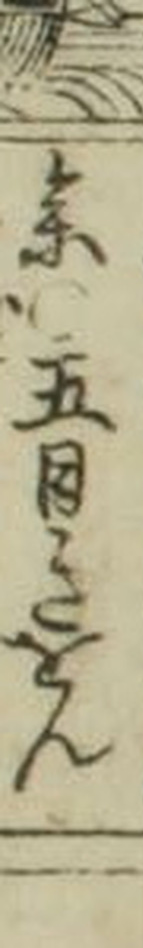祭○五日きをん
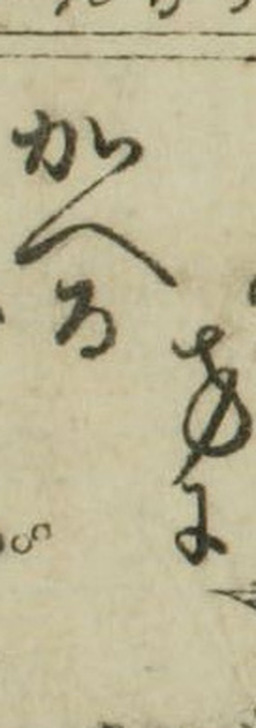かへる
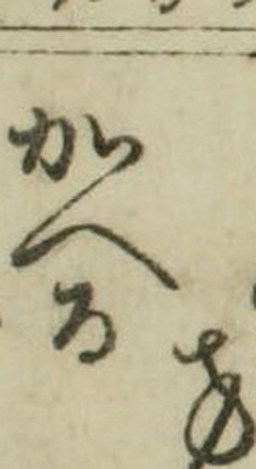かへる
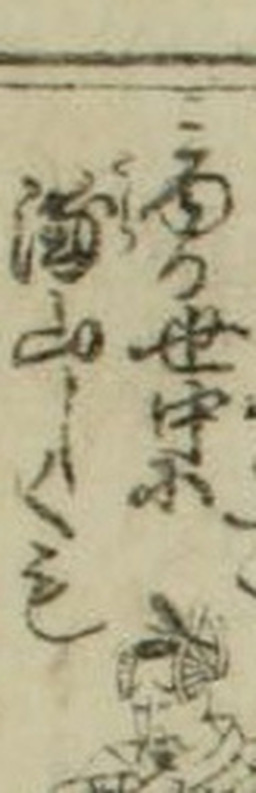浦山しくも
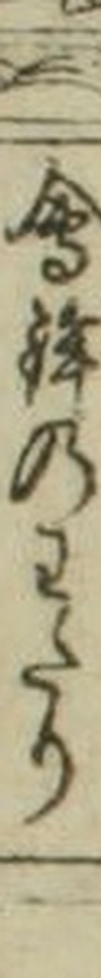会鉾のわたり
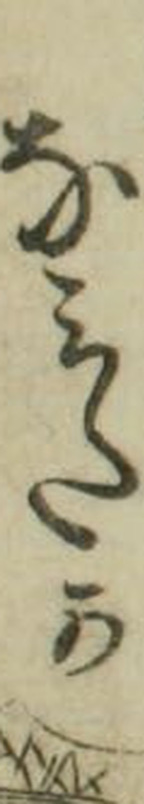なみだか
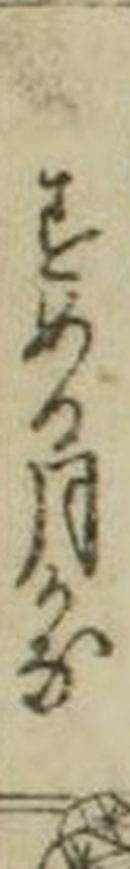すめる月かな
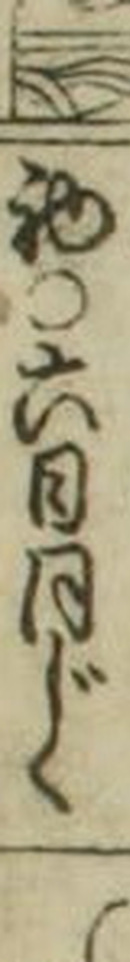初○六日同じく

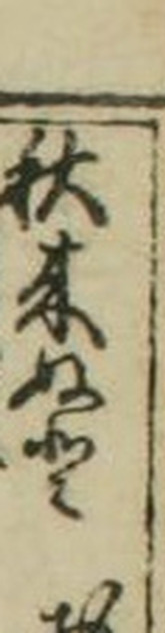秋来ぬと
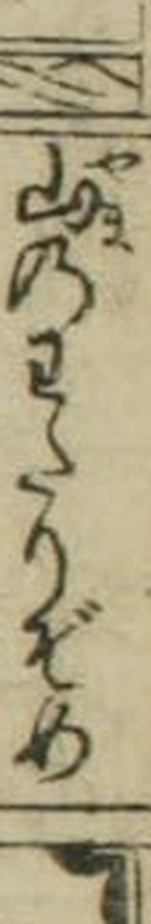山のわたりぞめ
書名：女源氏教訓鑑
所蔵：東京学芸大学附属図書館
